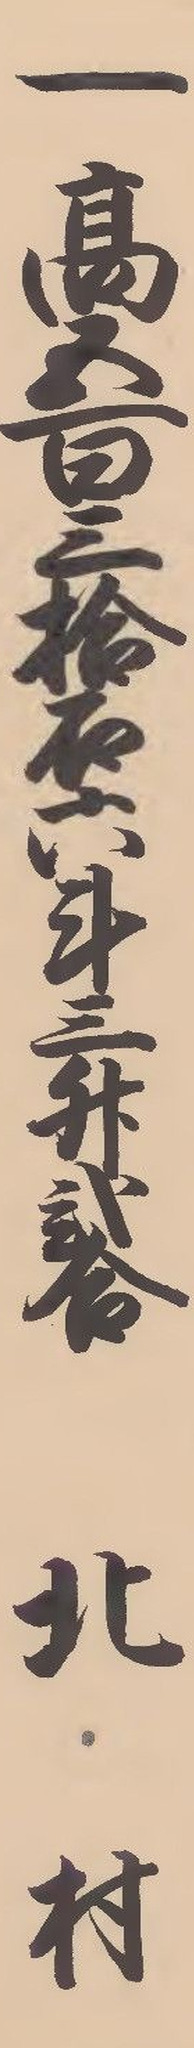一高五百三拾石六斗三升弐合北村

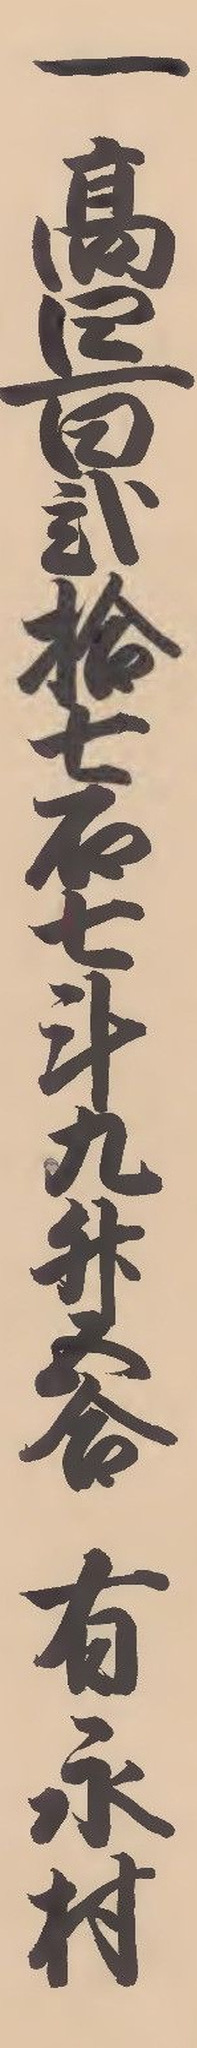一高四百弐拾七石七斗九升五合有永村
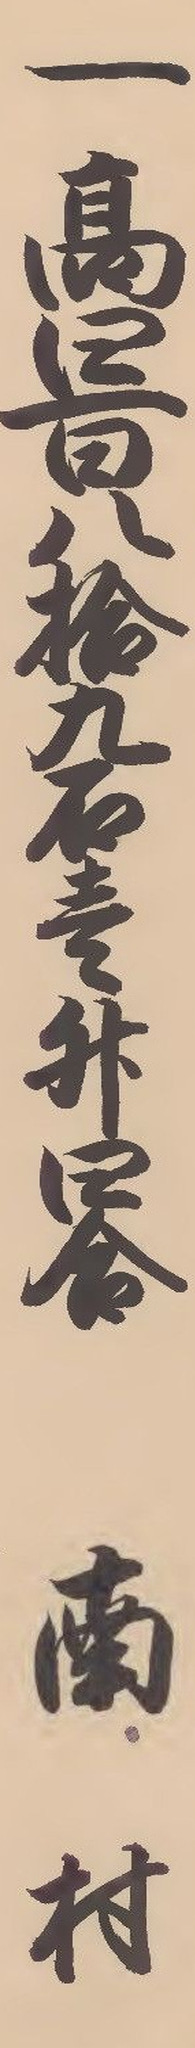一高四百八拾九石壱升四合南村
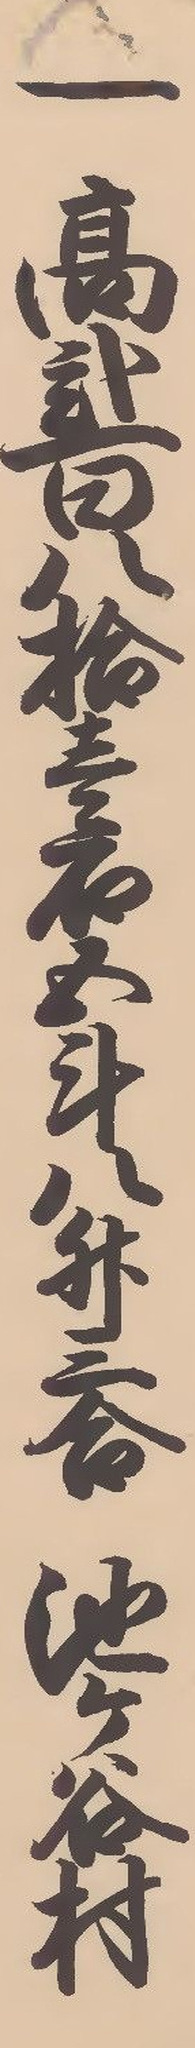一高弐百八拾壱石五斗八升三合池ヶ谷村
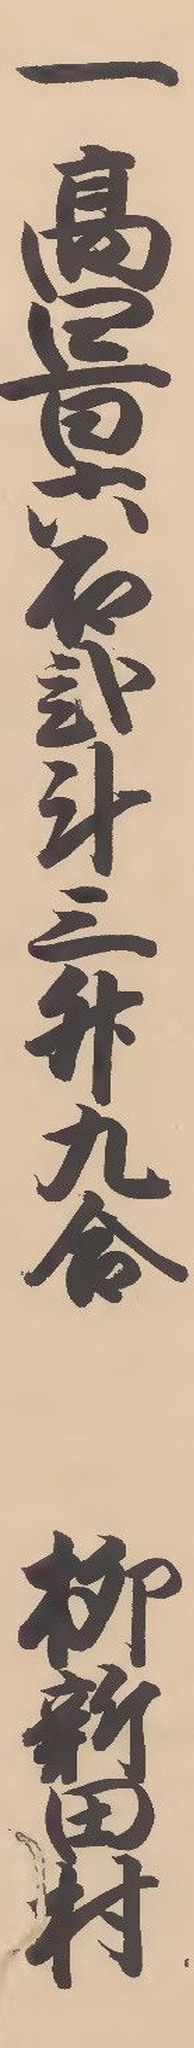一高四百六石弐斗三升九合柳新田村
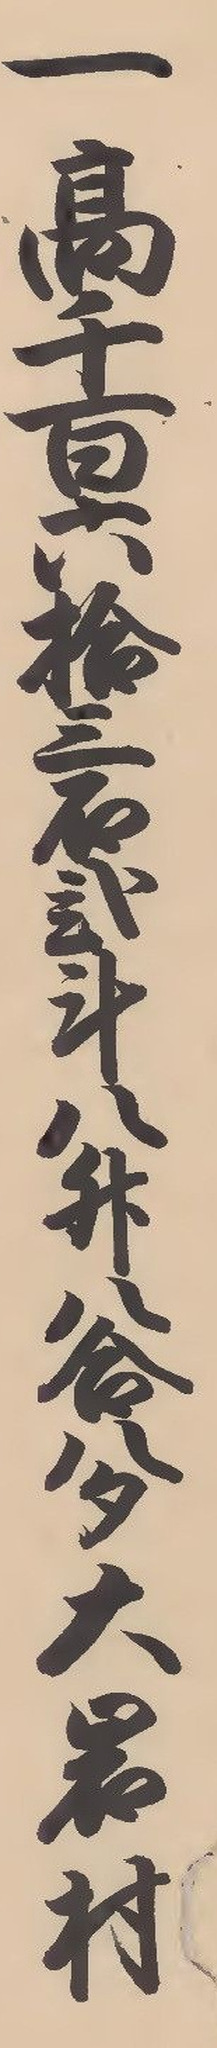一高千百六拾三石弐斗八升八合八勺大岩村
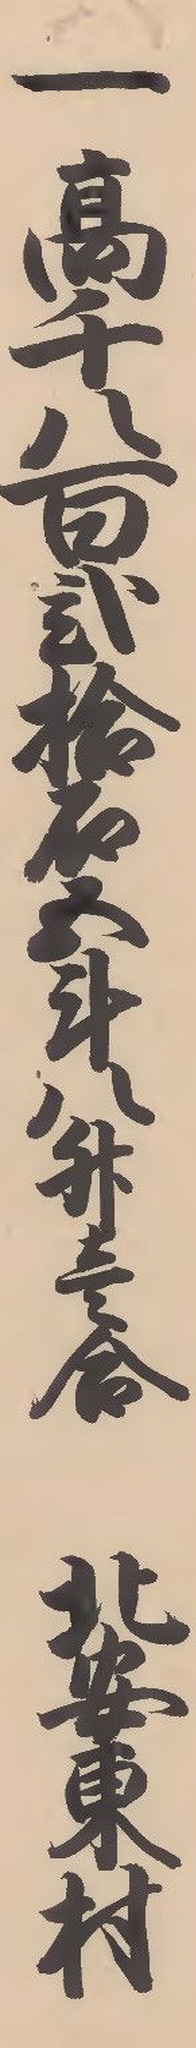一高千八百弐拾石五斗八升壱合北安東村
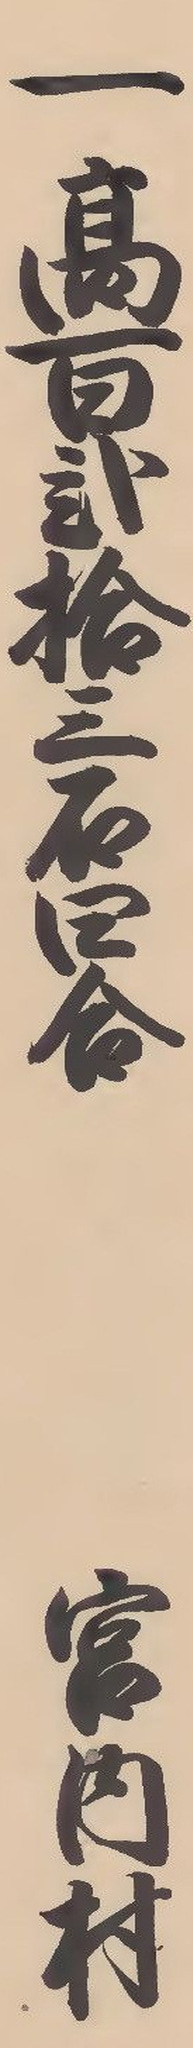一高百弐拾三石四合宮内村
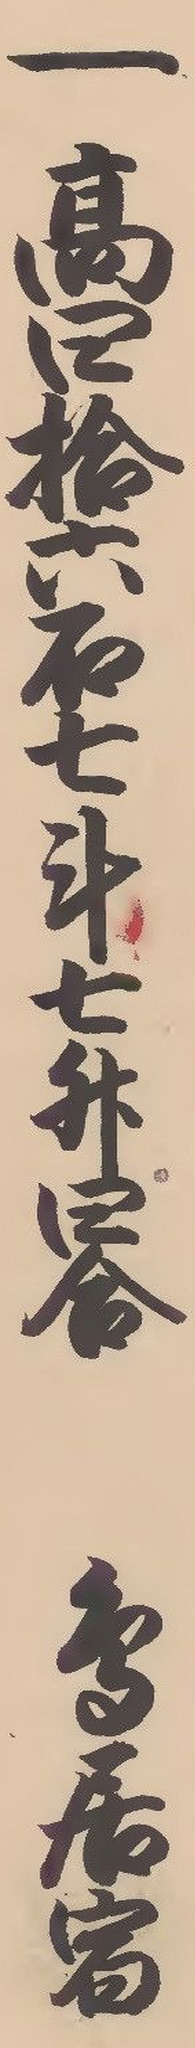一高四拾六石七斗七升四合鳥居宿

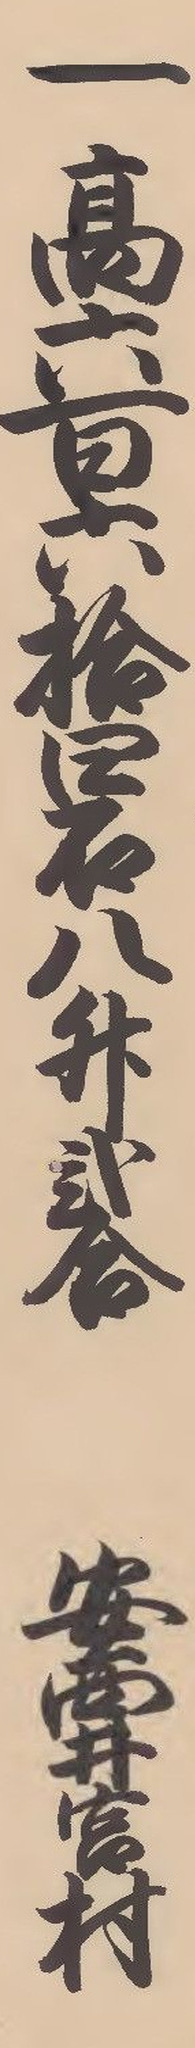一高六百六拾四石八升弐合安西井宮村
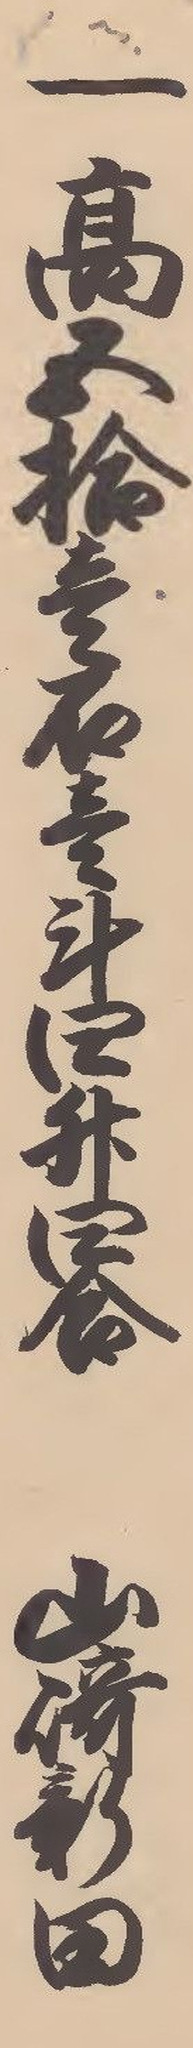一高五拾壱石壱斗四升四合山崎新田
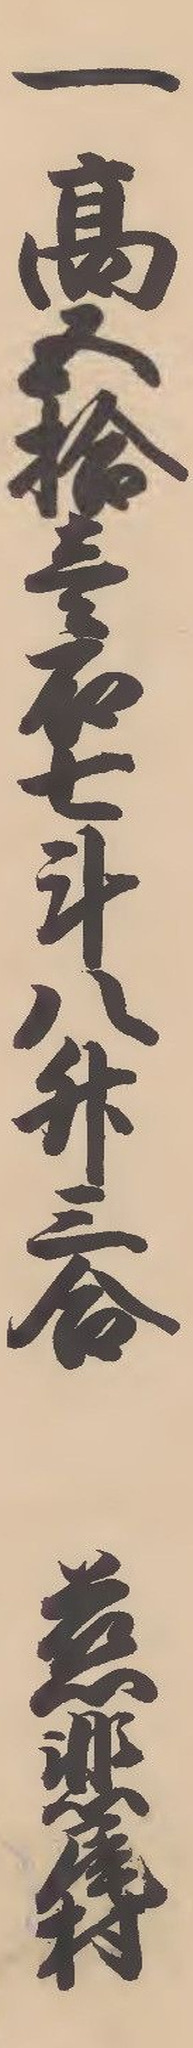一高五拾壱石七斗八升三合慈悲尾村
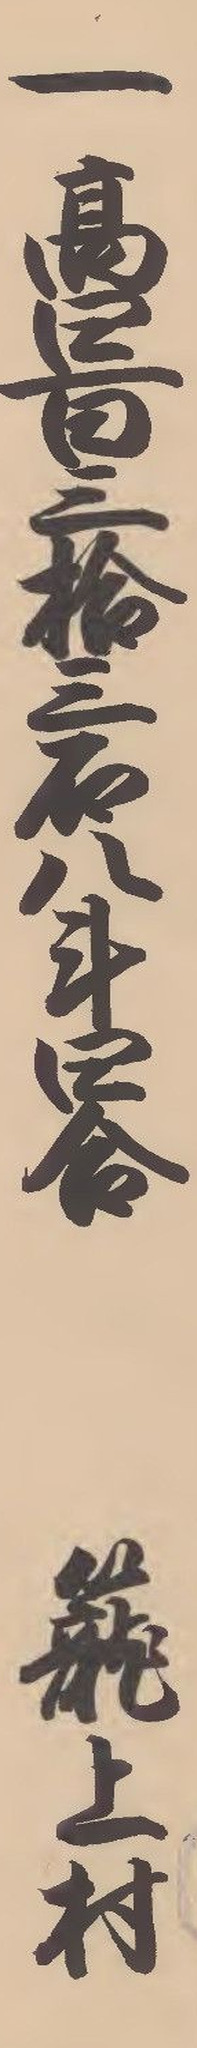一高四百三拾三石八斗四合籠上村
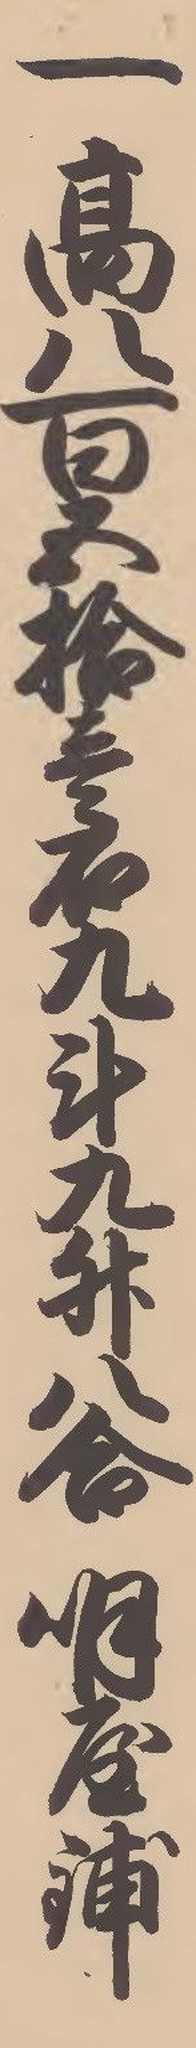一高八百五拾壱石九斗九升八合明屋鋪
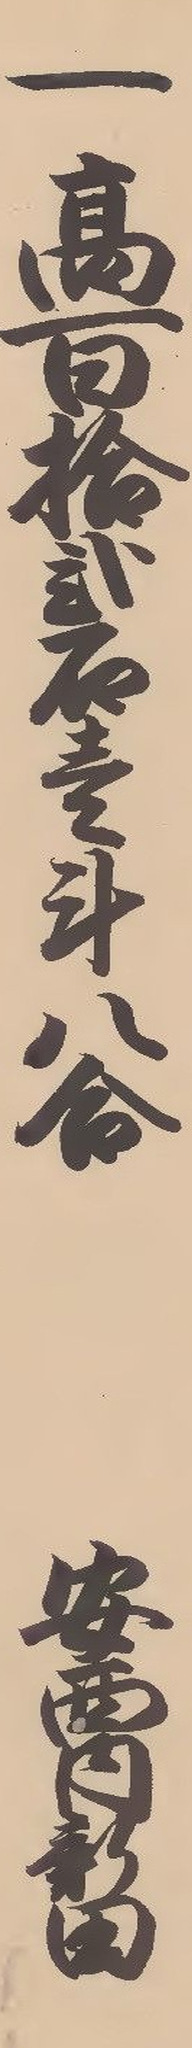一高百拾弐石壱斗八合安西内新田
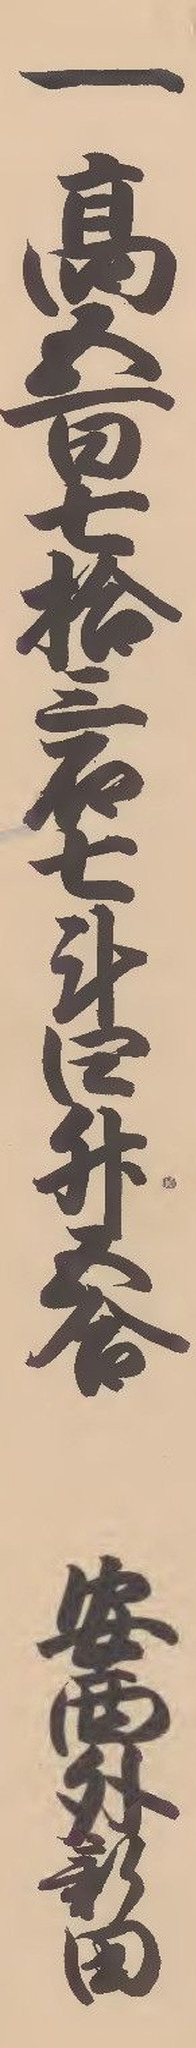一高五百七拾三石七斗四升五合安西外新田
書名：駿河国郷帳
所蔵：国立公文書館 National Archives of Japan
